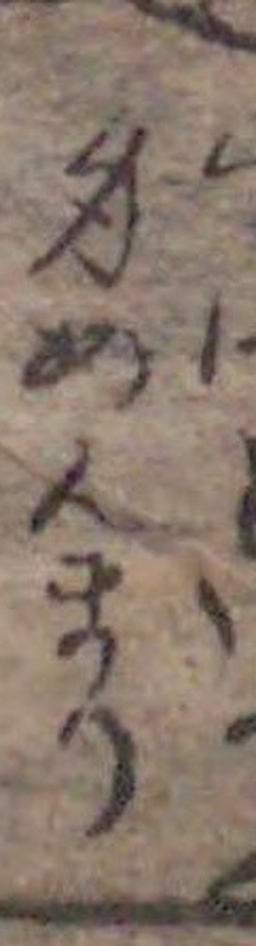身あんまり
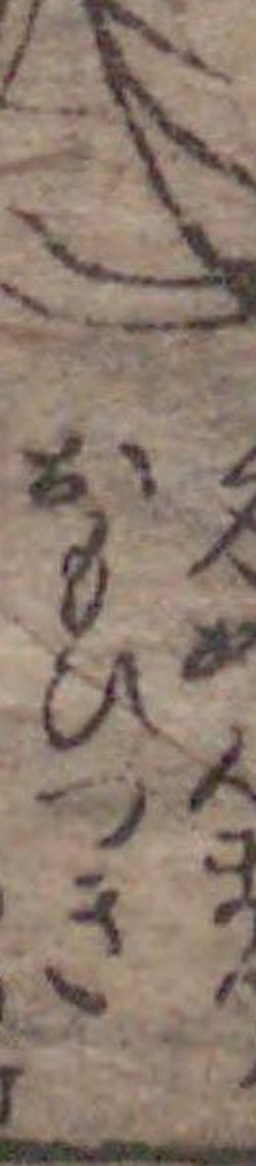おもひつき
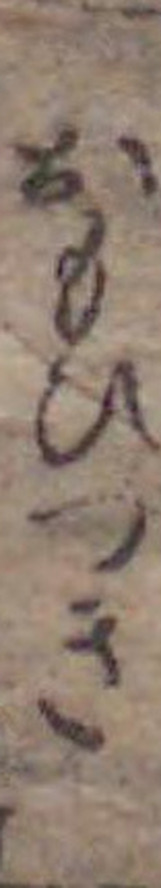おもひつき
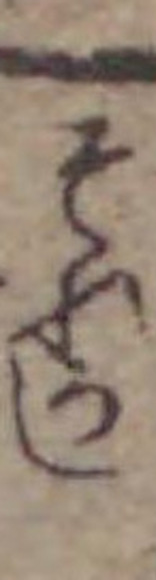それかし
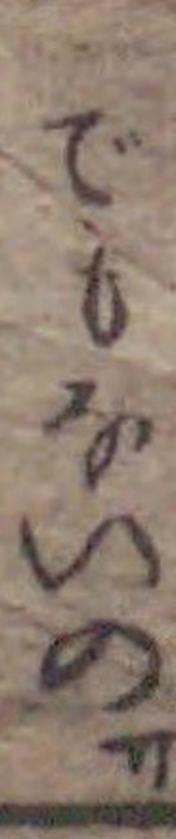でもないのサ
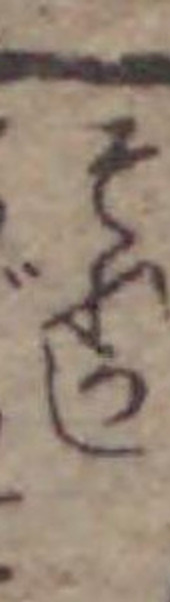それかし
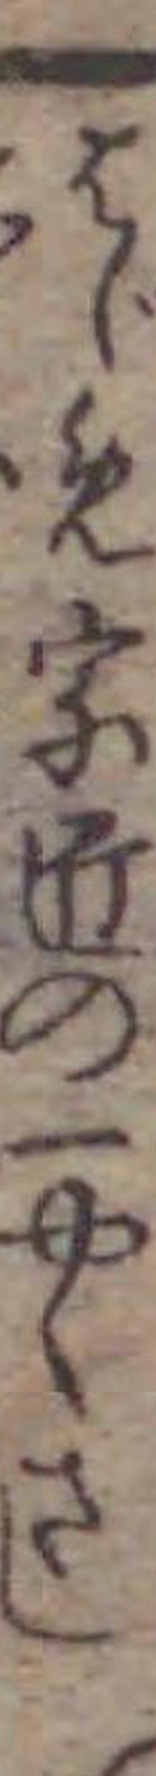はじめ字匠の一やくさし
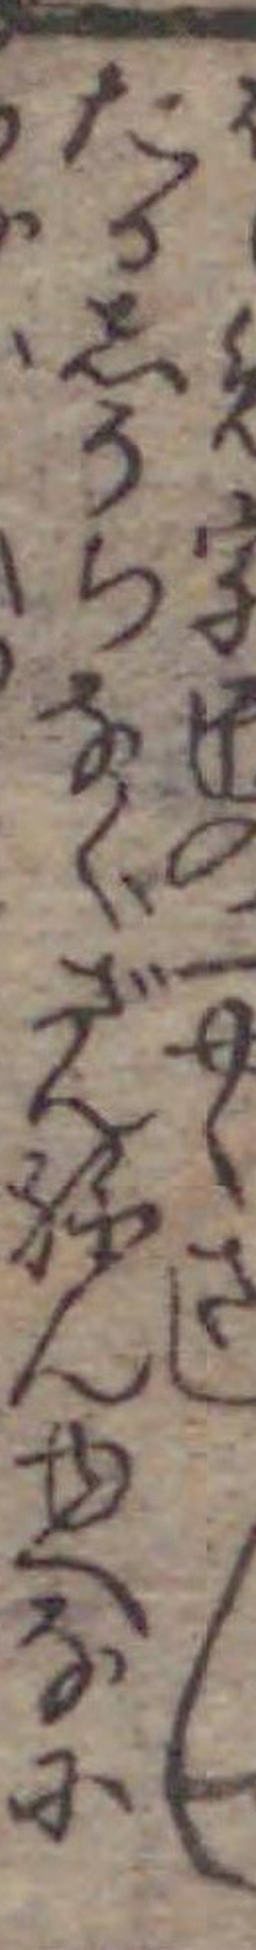たるしうちなくざんねんゆへなに
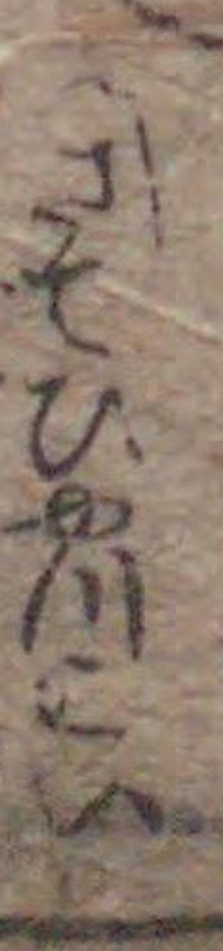〽さてひやつこい
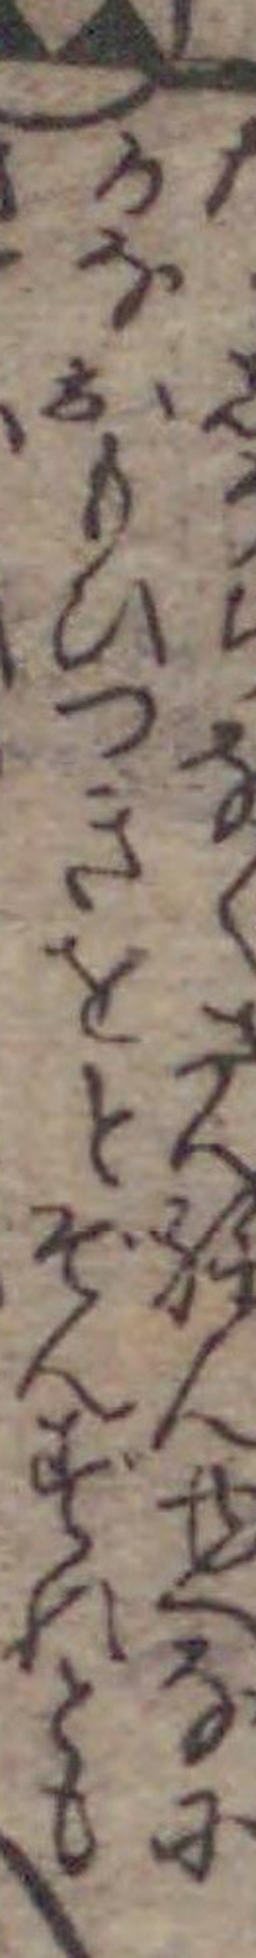かなおもひつきをとぞんずれども
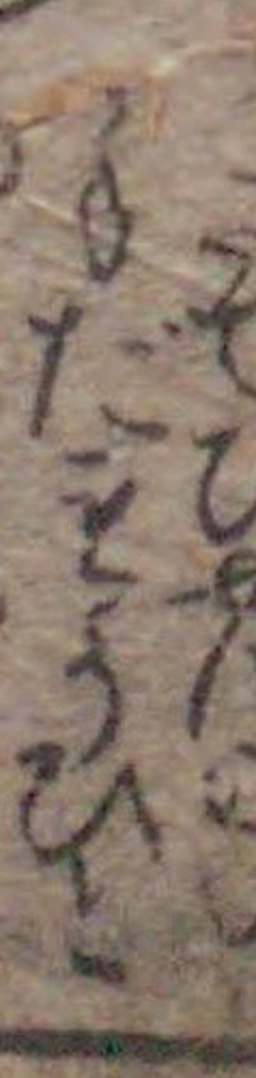手だもうひと
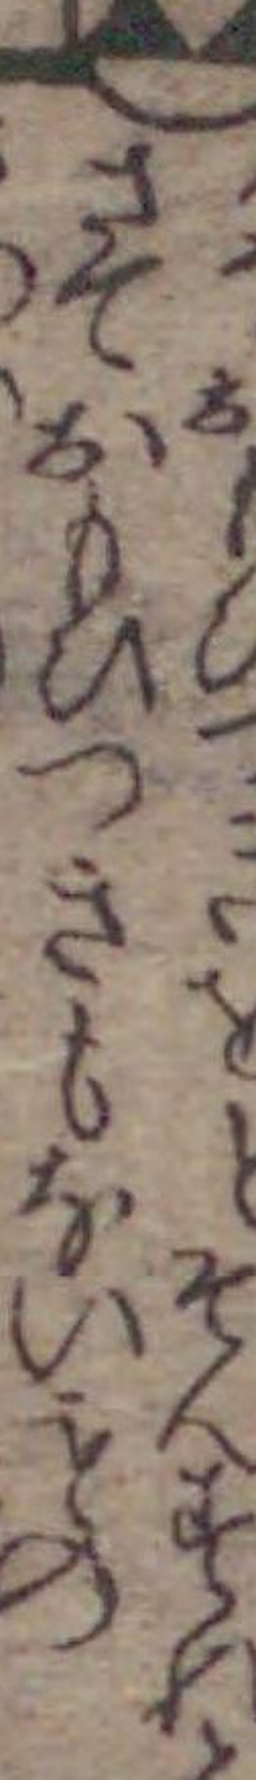さておもひつきもないもの
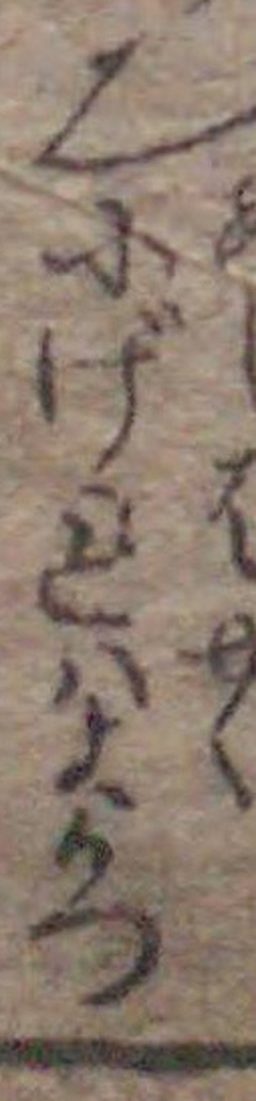にげれはよかつ
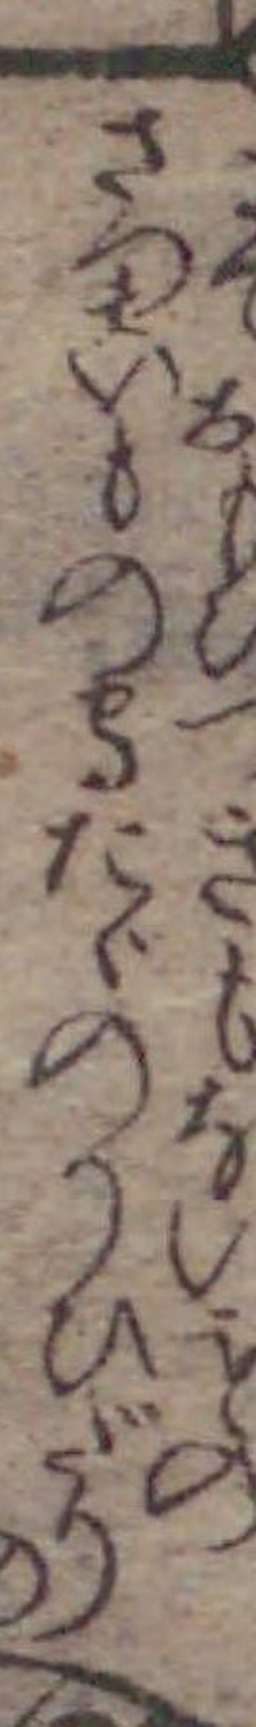さつまいもの守たゞのりひだりの
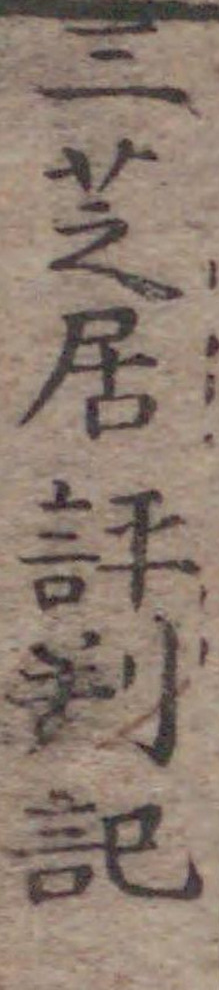三芝居評判記

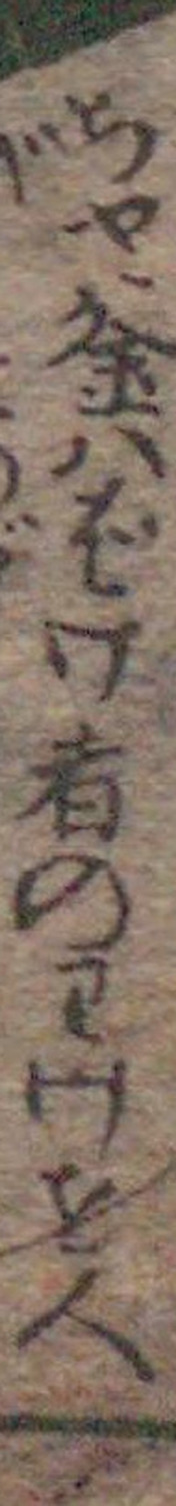ちや釜はばけ者のわけを人
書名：辞闘戦新根 （国会）
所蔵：国立国会図書館 National Diet Library, JAPAN
